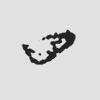日
